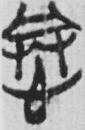惓（患）
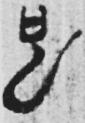也
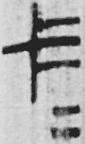下上
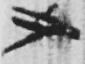之
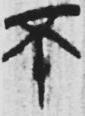不
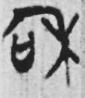和
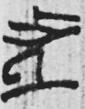者
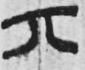亓（其）
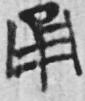甬（用）
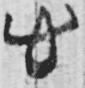心
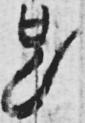也
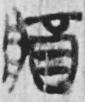𨟻（將）
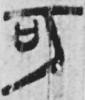可（何）
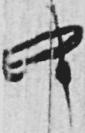女（如）
